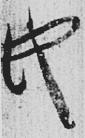女（如）
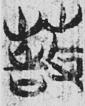○（曹）
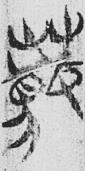○（沫）
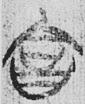○（答）
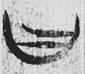曰
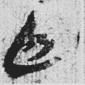臣
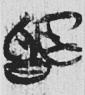○（聞）
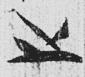之
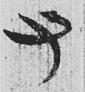又（有）
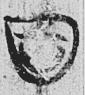固
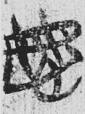○（謀）
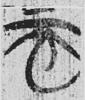而
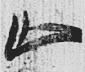亡
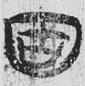固
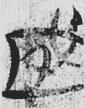城
